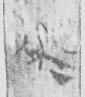九十=
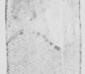五
